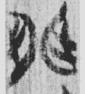門門
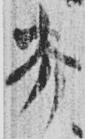大夫
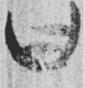曰
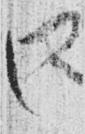女（汝）
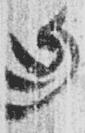出
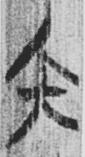內
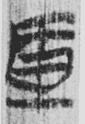庫
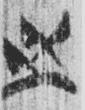之
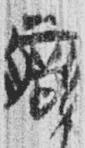囚
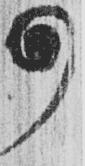回
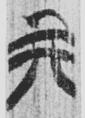而
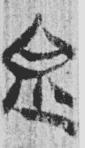余（予）
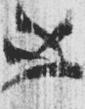之
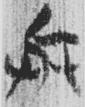兵
